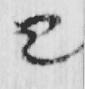巳
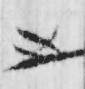之
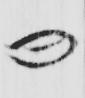日
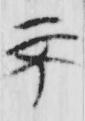不
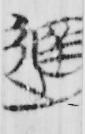𬨭（將）
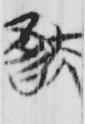○（胡）
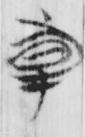倝
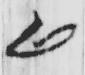㠯（以）
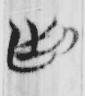○（廷）
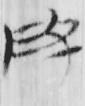阩
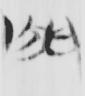門
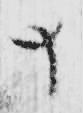又
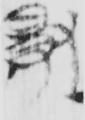敗
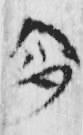宵
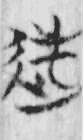逆
